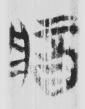𨟻
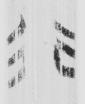行
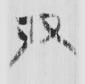四
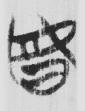{母日}
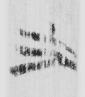之
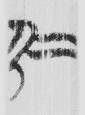𡰥
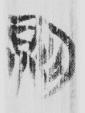則
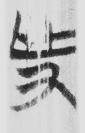拃
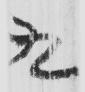九
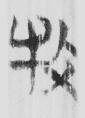牧
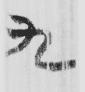九
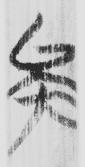矣
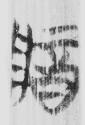𨟻
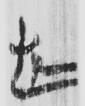{屮亡}
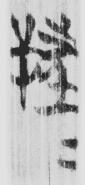{矢㞷}
